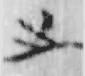之
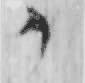人
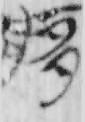痑
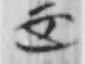正
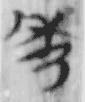秀
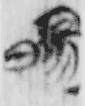暘
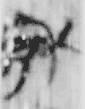穆
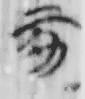亥
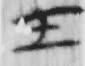壬
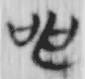申
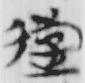遊
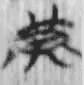黃
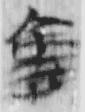愴
